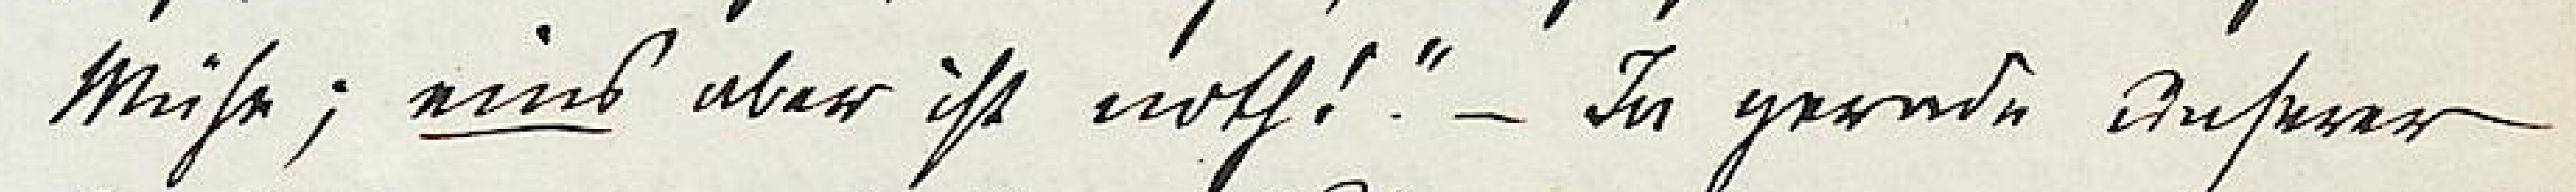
Mühe; eins aber ist noth!" _ Ja gerade unserer
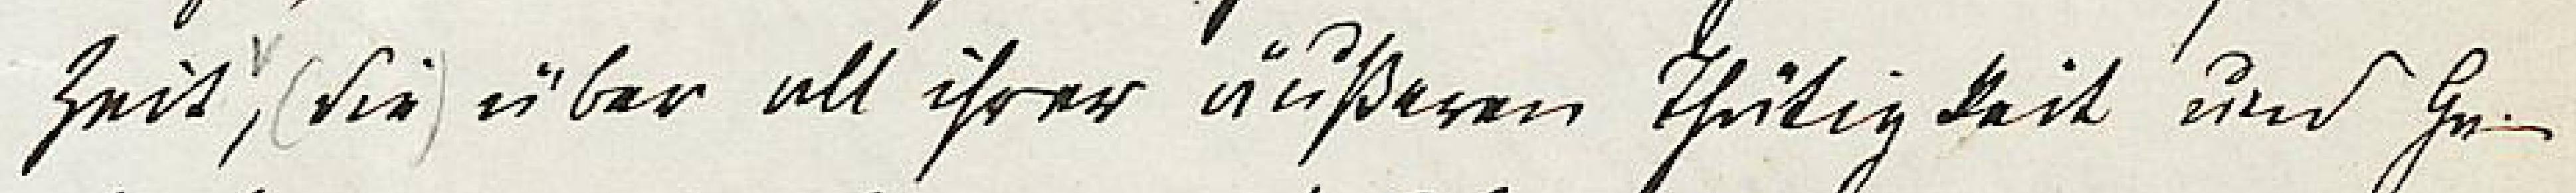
Zeit, (die) über all ihrer äußeren Thätigkeit und Ge¬
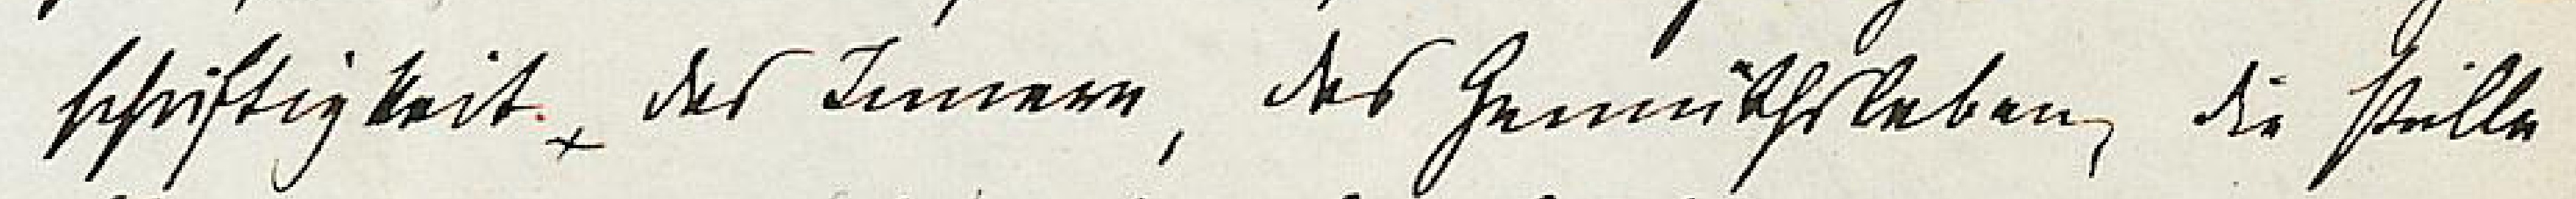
schäftigkeit, das Innere, das Gemüthsleben, die stille
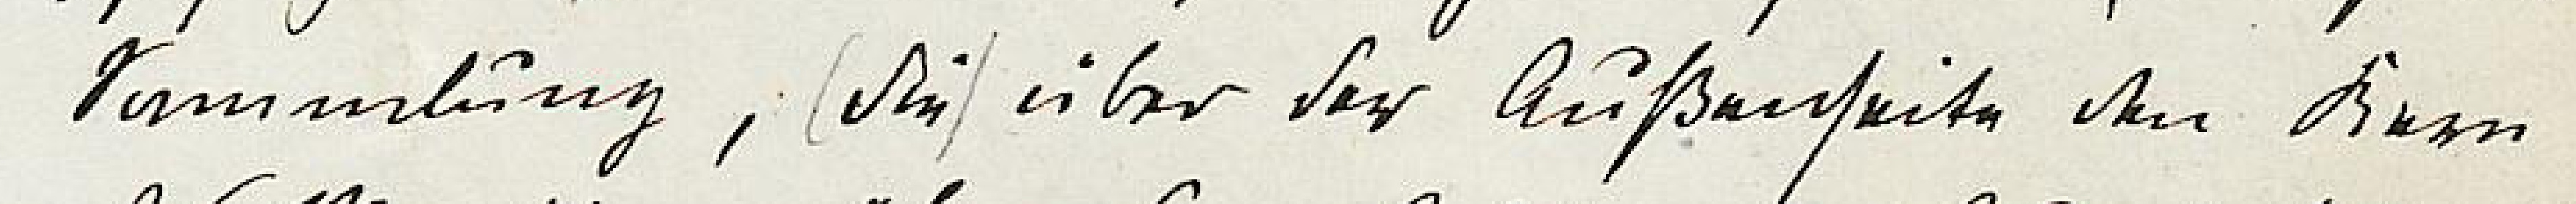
Sammlung, (die) über der Außenseite den Kern
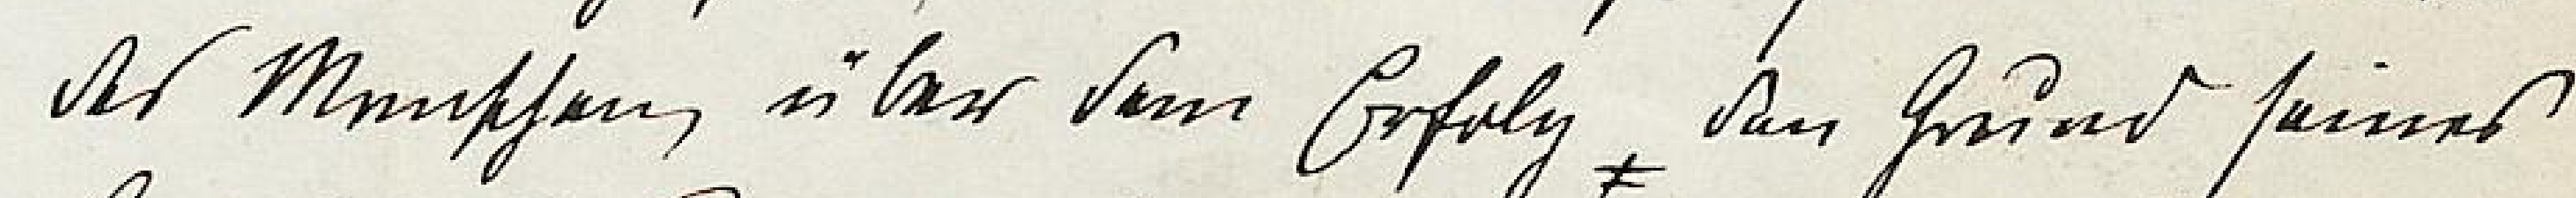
des Menschen, über den Erfolg, den Grund seines
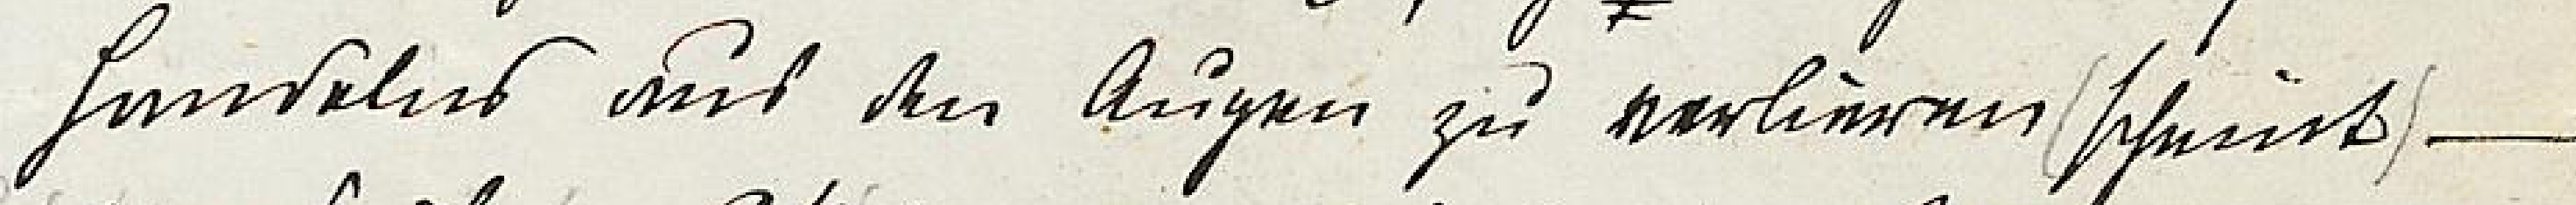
Handelns aus den Augen zu verlieren (scheint) _
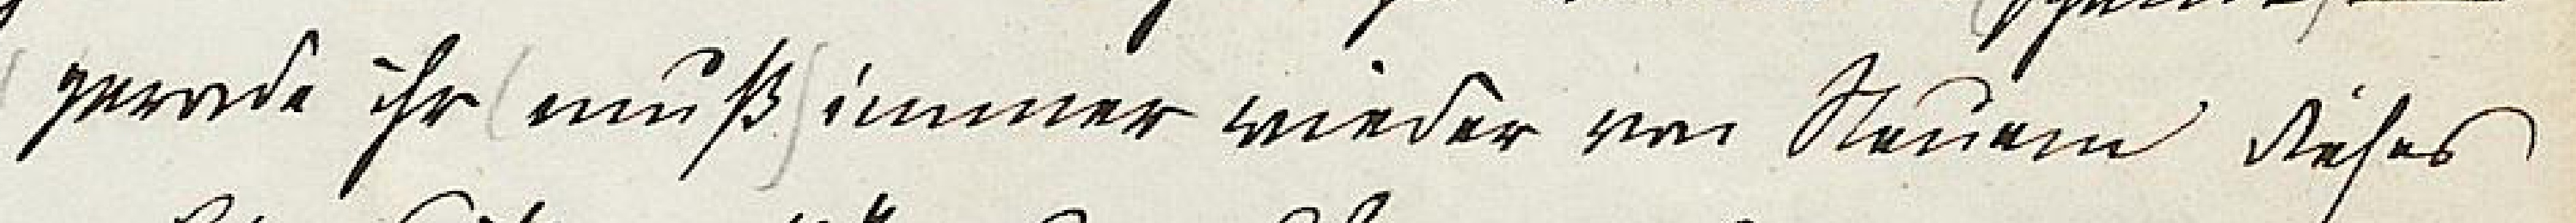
gerade ihr (muß) immer wieder von Neuem dieses
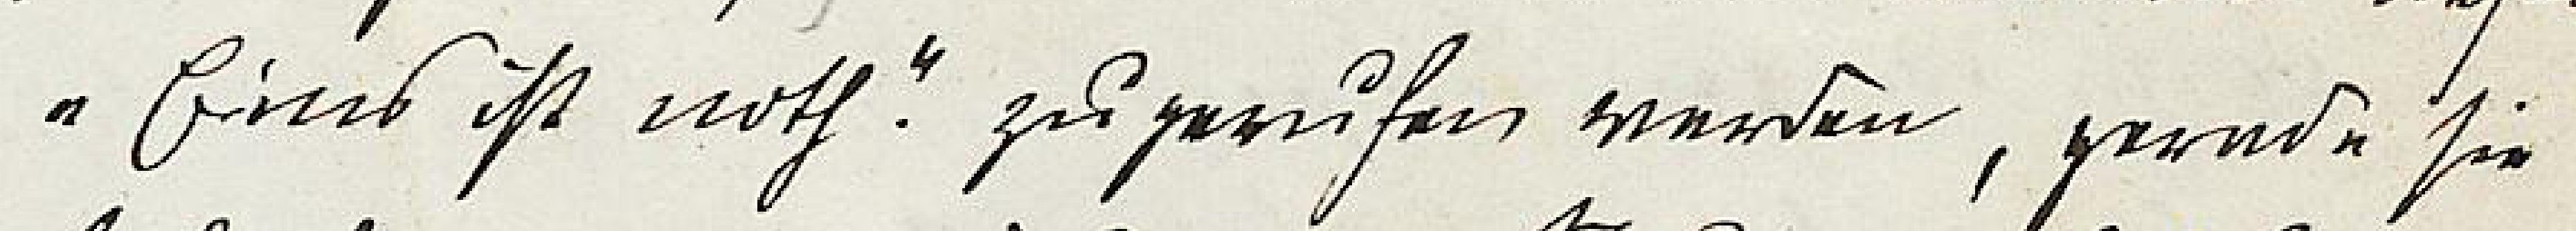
"Eins ist noth." zugerufen werden, derade sie
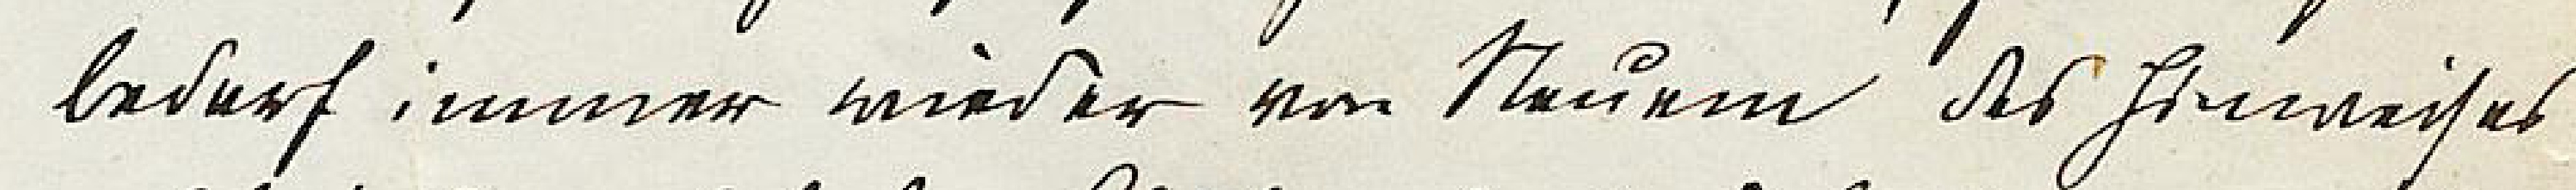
bedarf immer wieder von Neuem des Hinweises
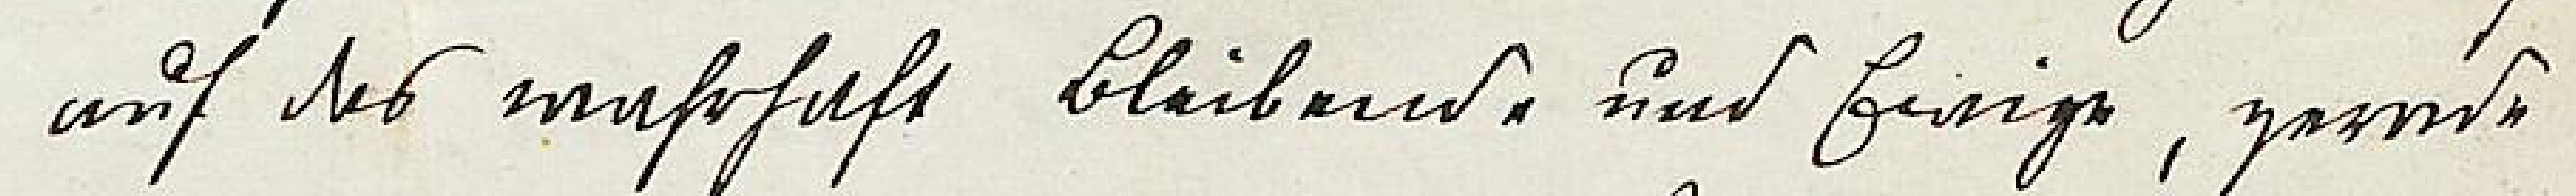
auf das wahrhaft Bleibende und Ewige, gerade
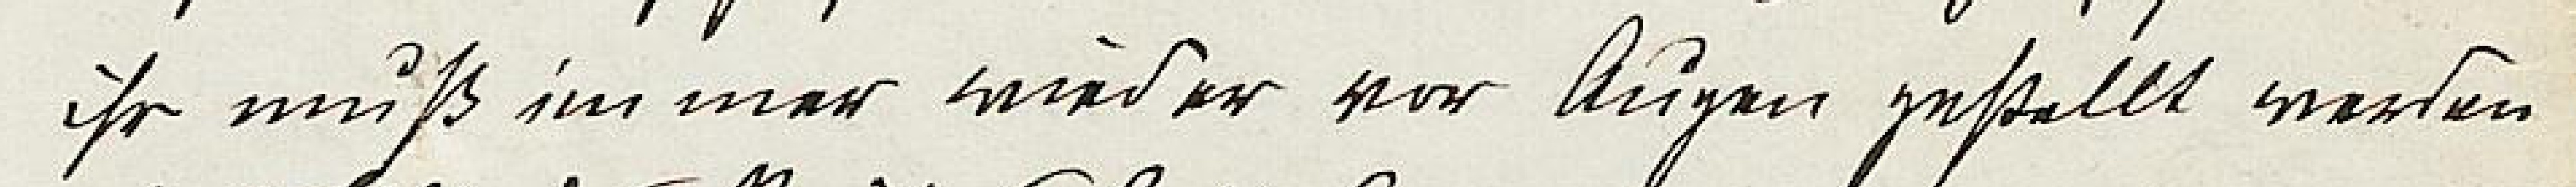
ihr muß immer wieder vor Augen gestellt werden
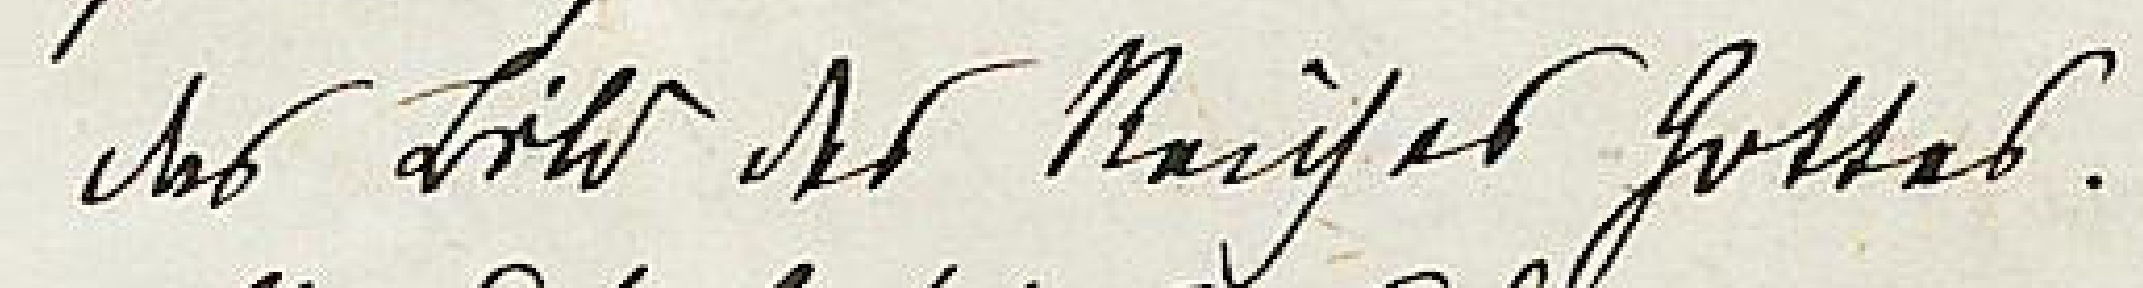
das Bild des Reiches Gottes.
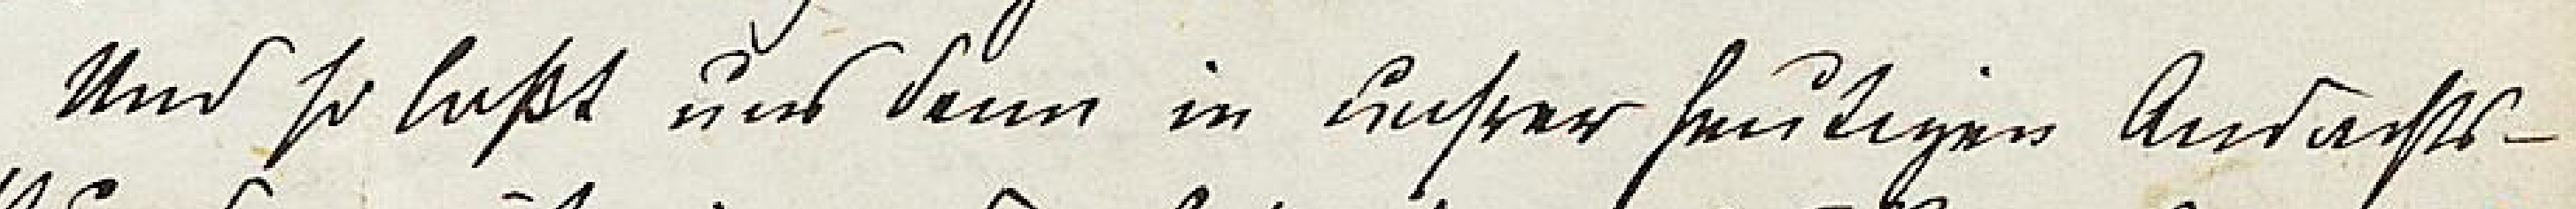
Und so laßt uns denn in unsrer heutigen Andachs¬
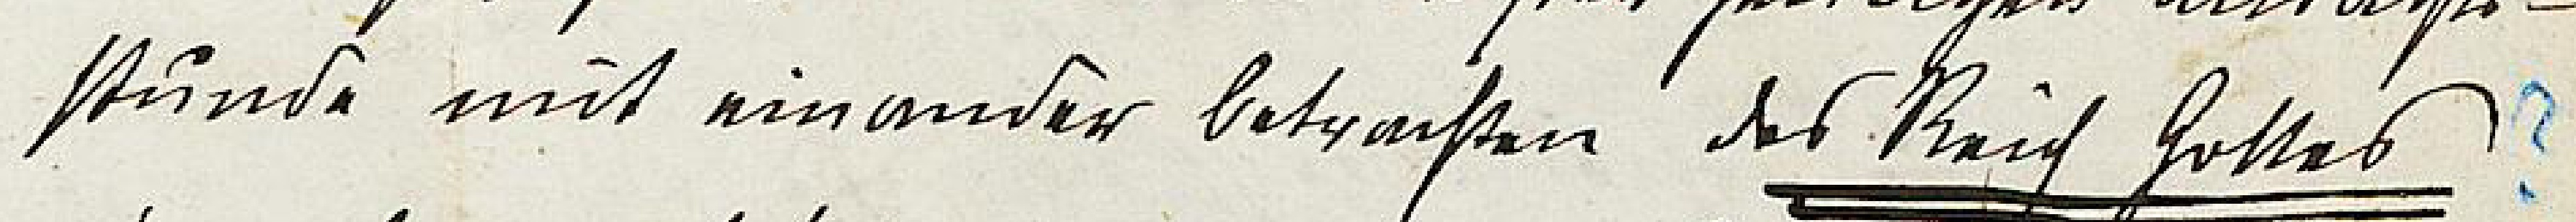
stunde miteinander betrachten das Reich Gottes
